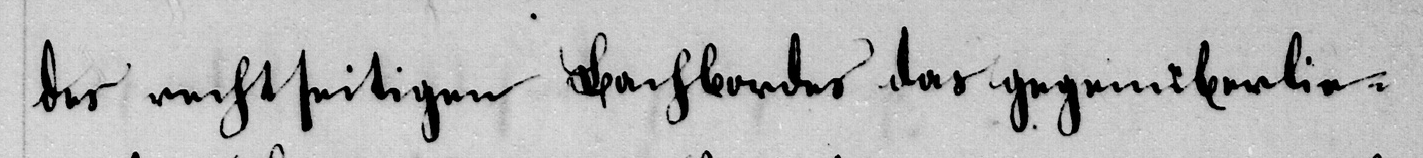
des rechtseitigen Bachbordes das gegenüberlie¬
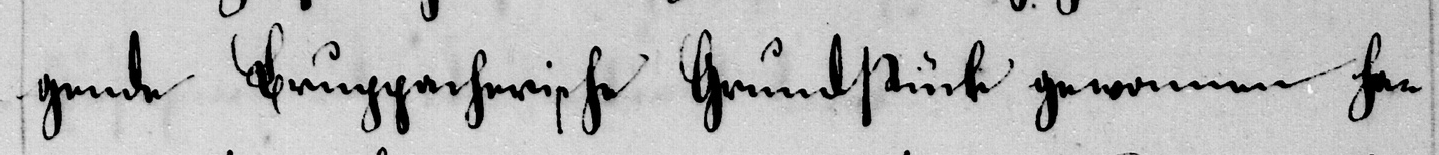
gende Bruppacherische Grundstück gewonnen ha¬
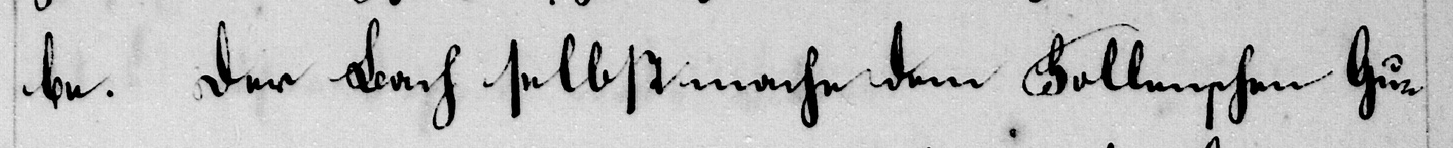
be. Der Bach selbst mache dem Follenschen Gu¬
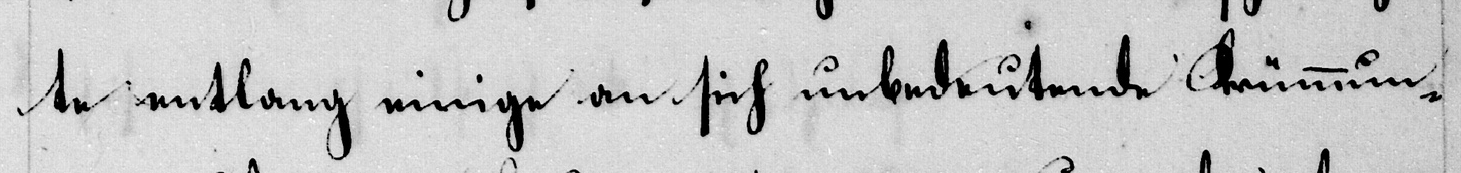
te entlang einige an sich unbedeutende Krümmun¬
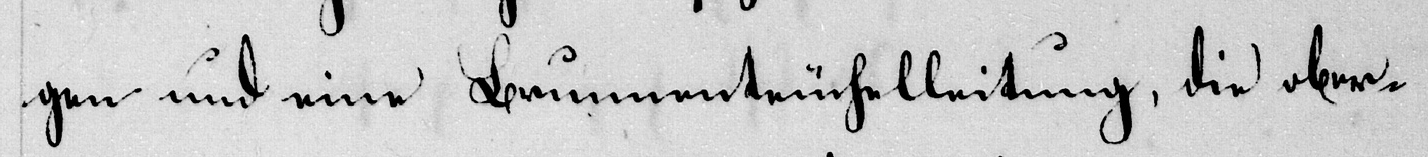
gen und eine Brunnenteuchelleitung, die ober¬
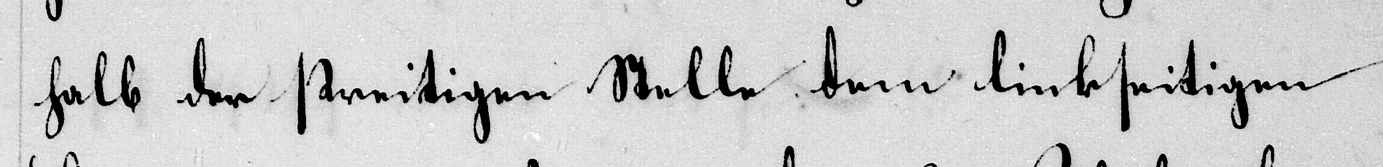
halb der streitigen Stelle dem linkseitigen
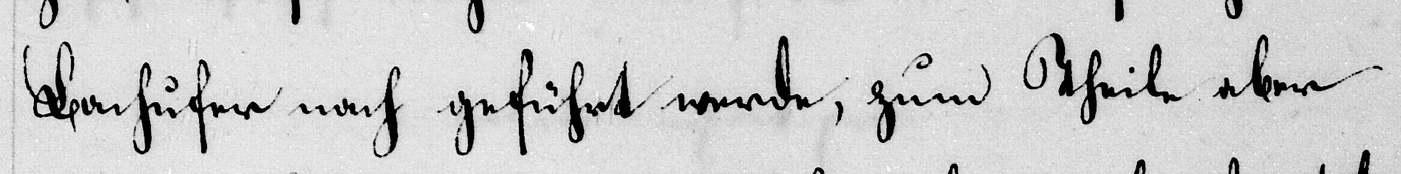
Bachufer nach geführt werde, zum Theile aber
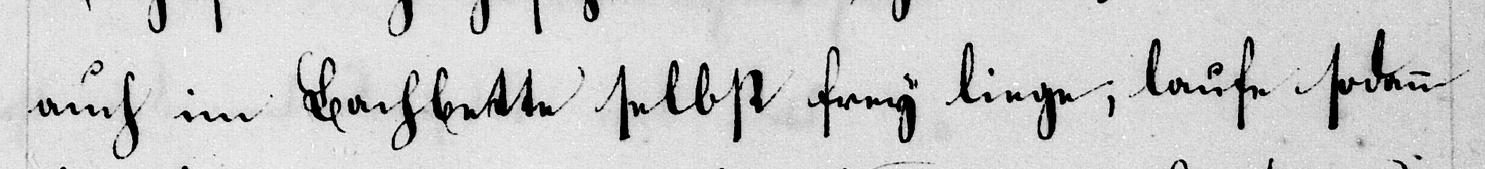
auch im Bachbette selbst frey liege, laufe sodann
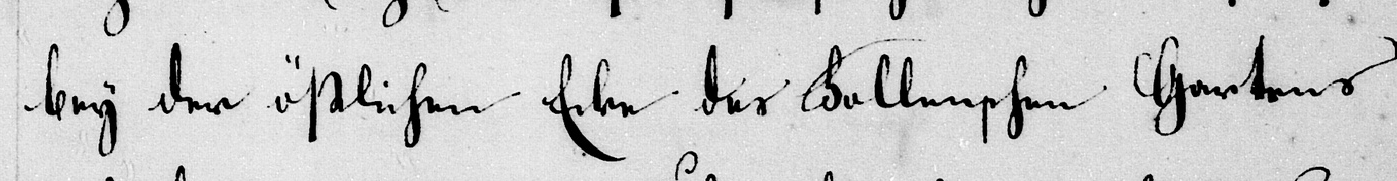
bey der östlichen Ecke des Follenschen Gartens
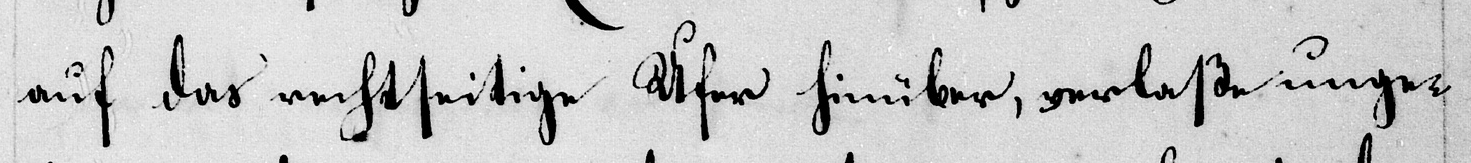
auf das rechtseitige Ufer hinüber, verlaße unge¬
